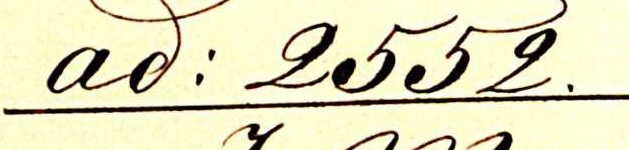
ad: 2552
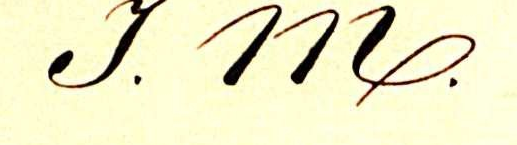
JM
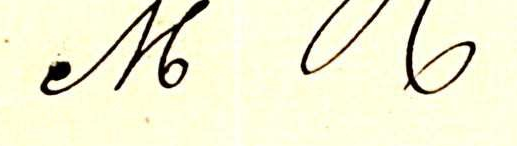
MR
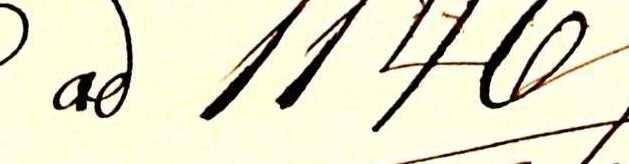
ad 1146
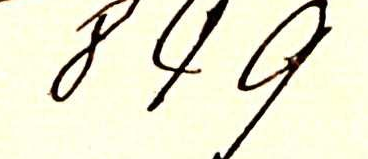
849
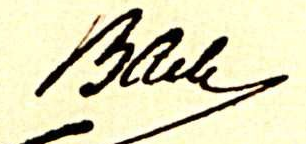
Bach
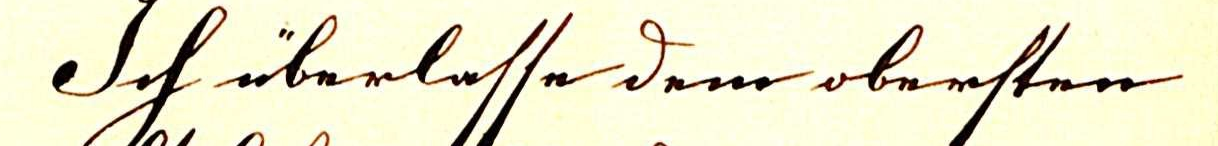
Ich überlasse dem obersten
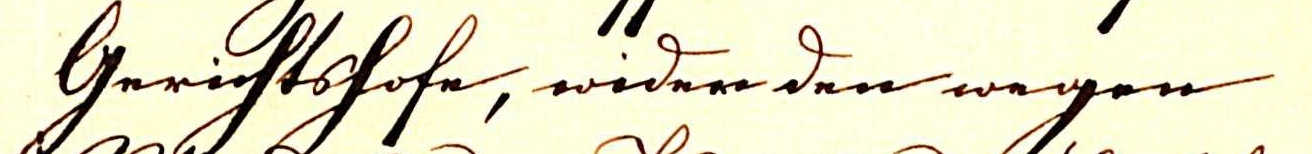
Gerichtshofe, wider den wegen
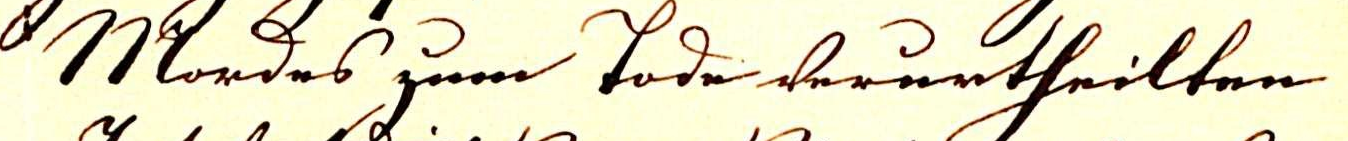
Mordes zum Tode verurtheilten
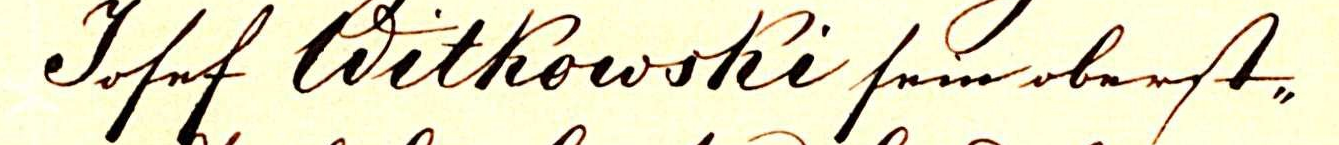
Joseph Witkowski, sein oberst¬
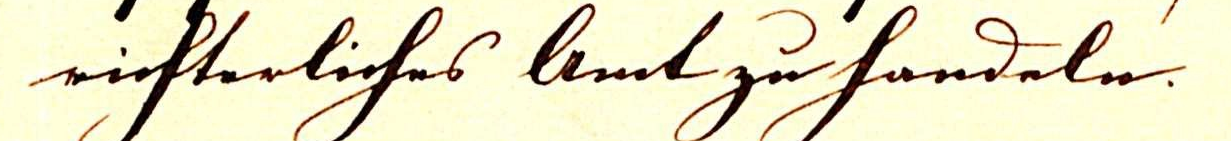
richterliches Amt zu handeln.
